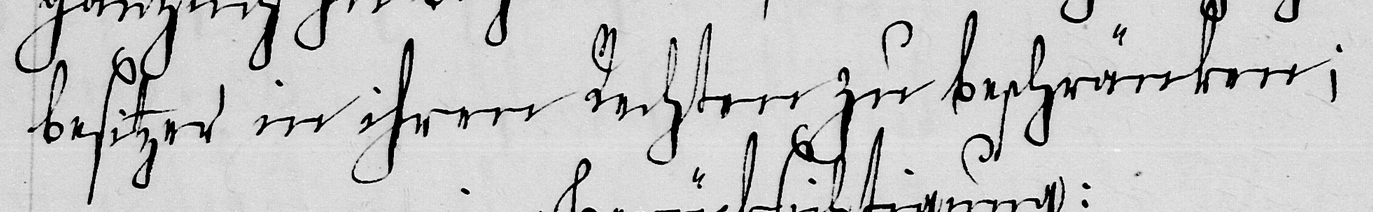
besitzer in ihren Rechten zu beschränken;
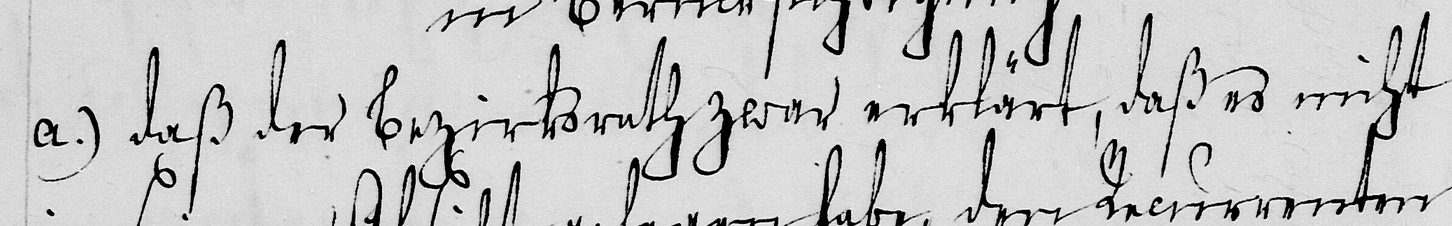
a.) daß der Bezirksrath zwar erklärt, daß es nicht
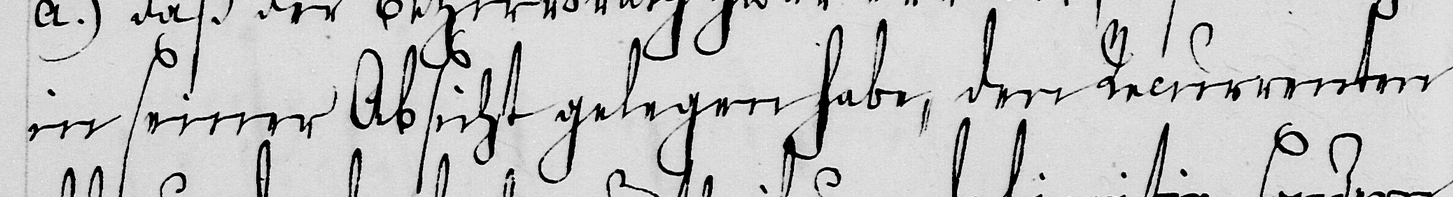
in seiner Absicht gelegen habe, den Recurrenten
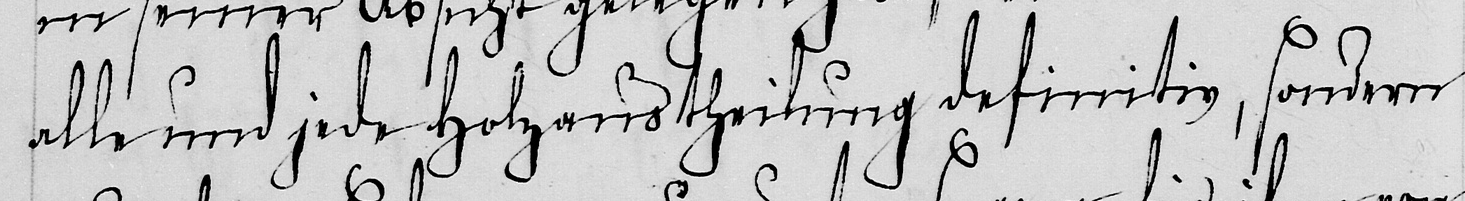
alle und jede Holzaustheilung definitiv, sondern
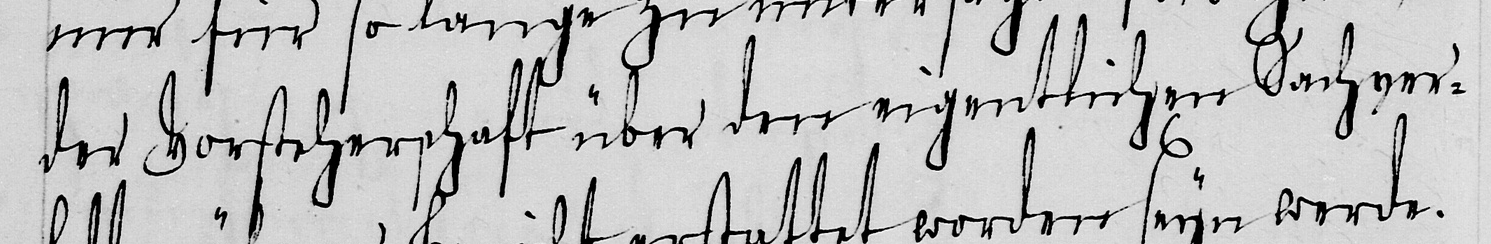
der Vorsteherschaft über den eigentlichen Sachver¬
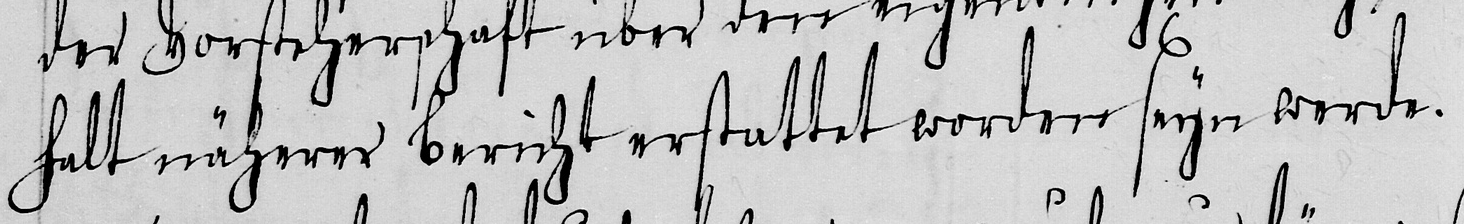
halt näherer Bericht erstattet worden seyn werde.
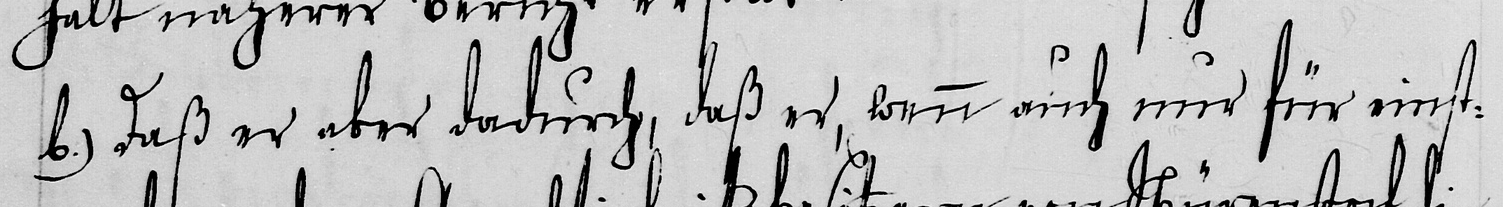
b.) Daß er aber dadurch, daß er, wenn auch nur für einst¬
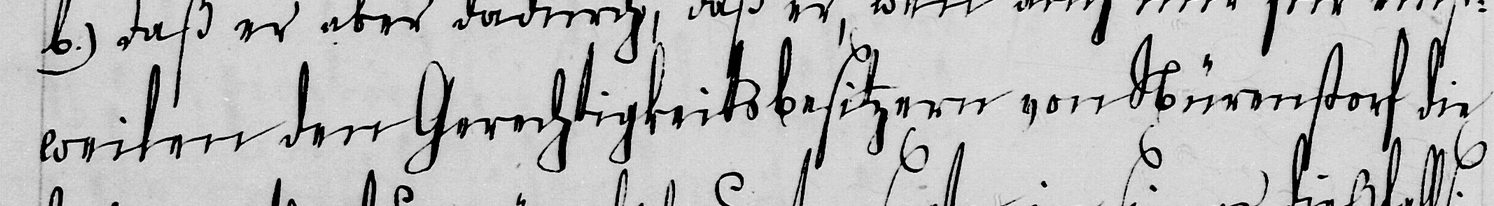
weilen den Gerechtigkeitsbesitzern von Nürenstorf die
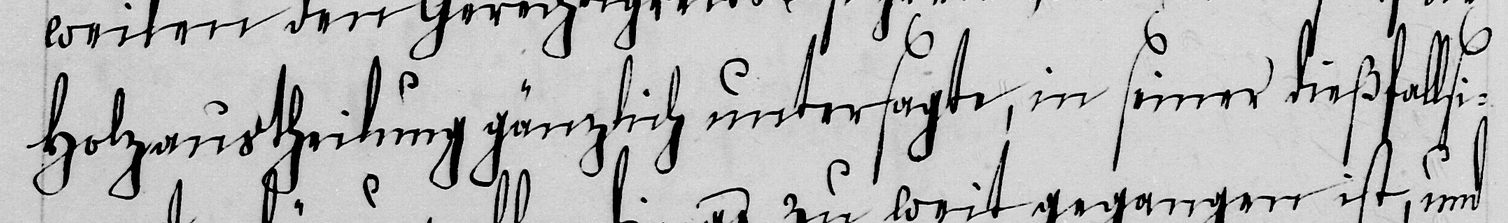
Holzaustheilung gänzlich untersagte, in seiner dießfälli¬
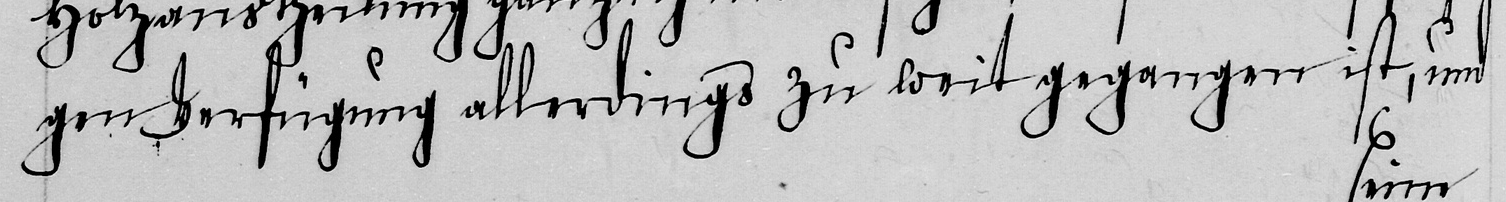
gen Verfügung allerdings zu weit gegangen ist, und
